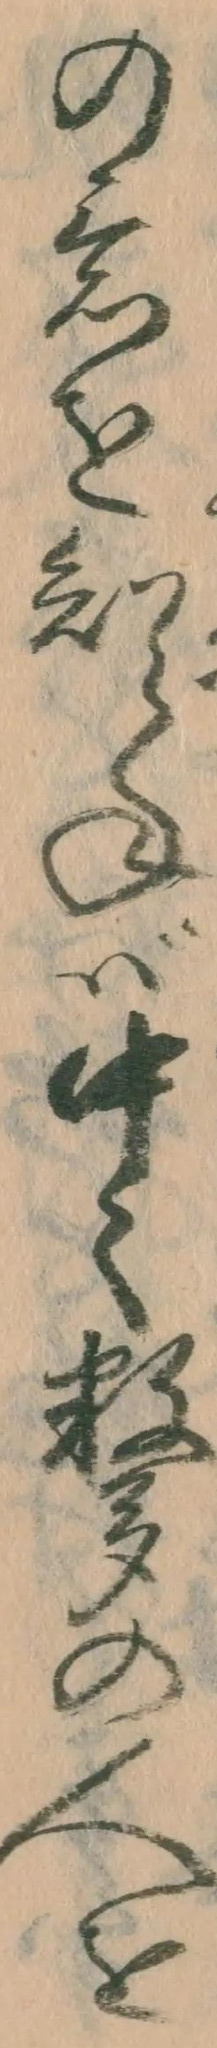の意を知らねバ中々数多の人を
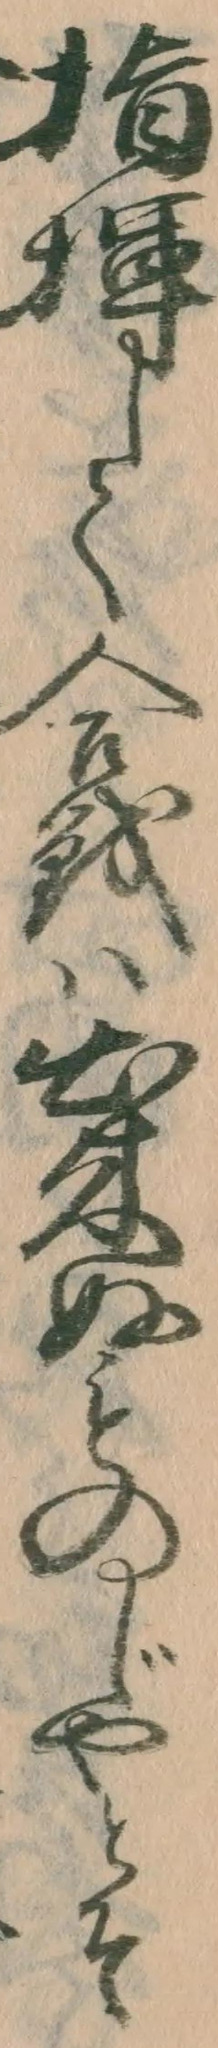指揮して合戦ハ出来ぬものじやとそ
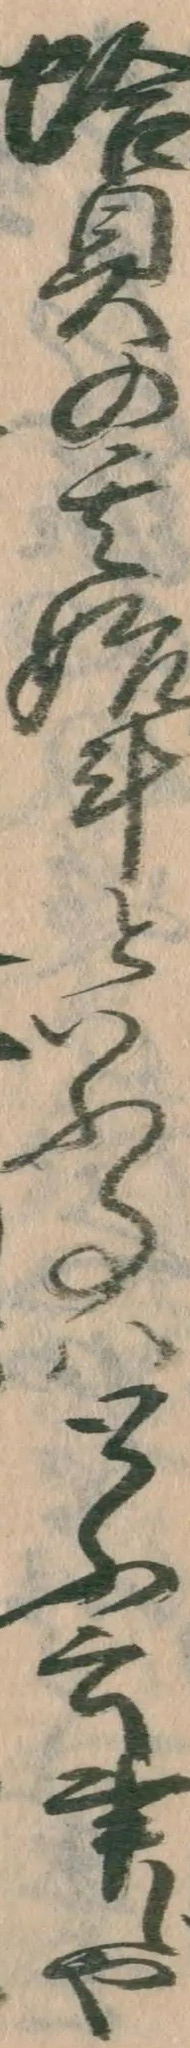蛤貝の其始斗といふ事ハとふ云事じや
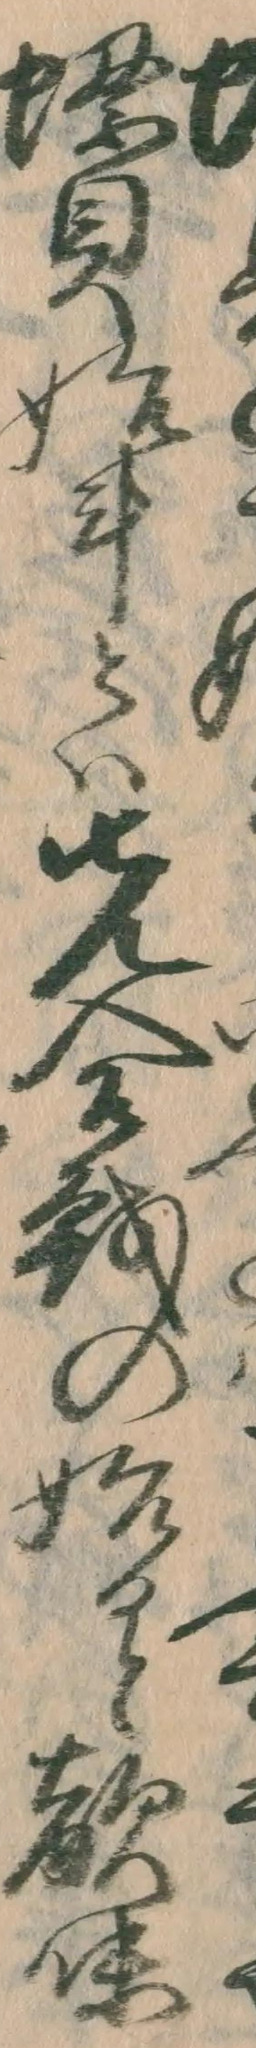螺貝始斗とハ先合戦の始ると敵味
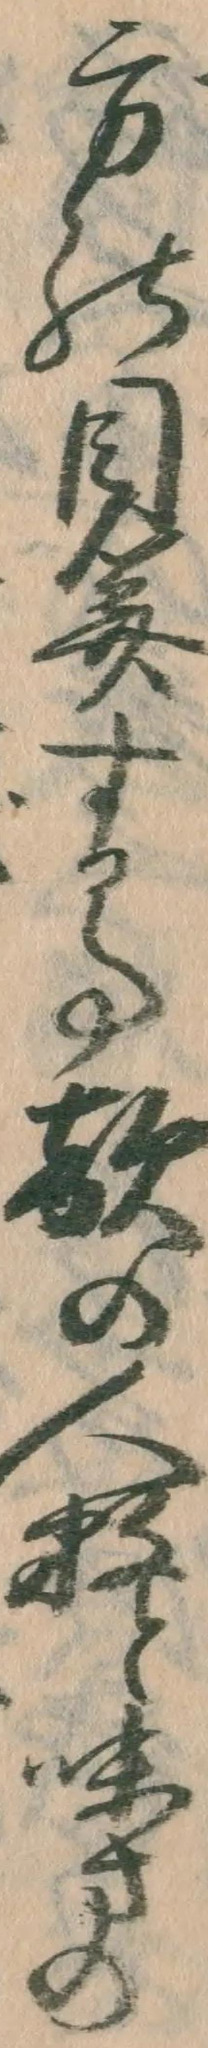方の目算する事敵の人数と味方の
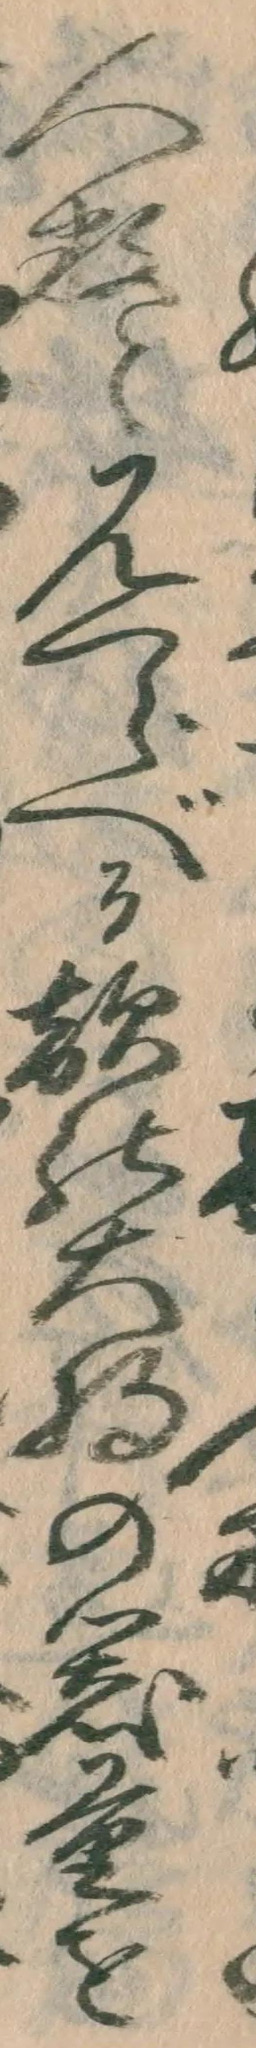人数と見くらべる敵の大将の器量を
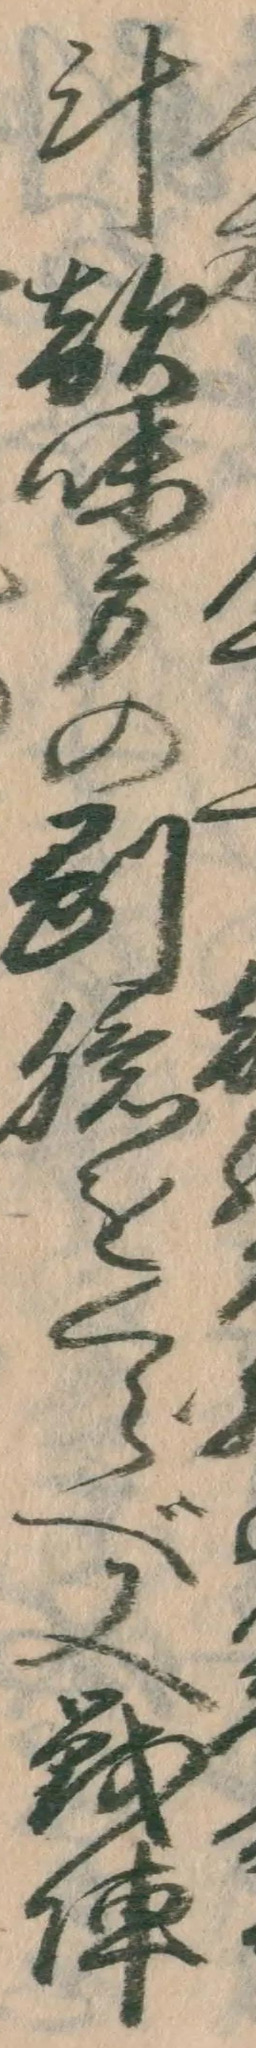計敵味方の剛臆をくらべ又戦陣
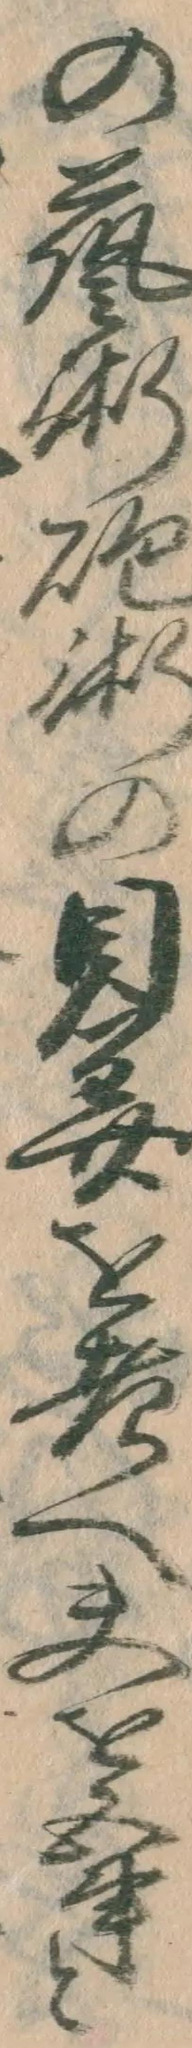の藝術砲術の目算を考へ夫を五事と
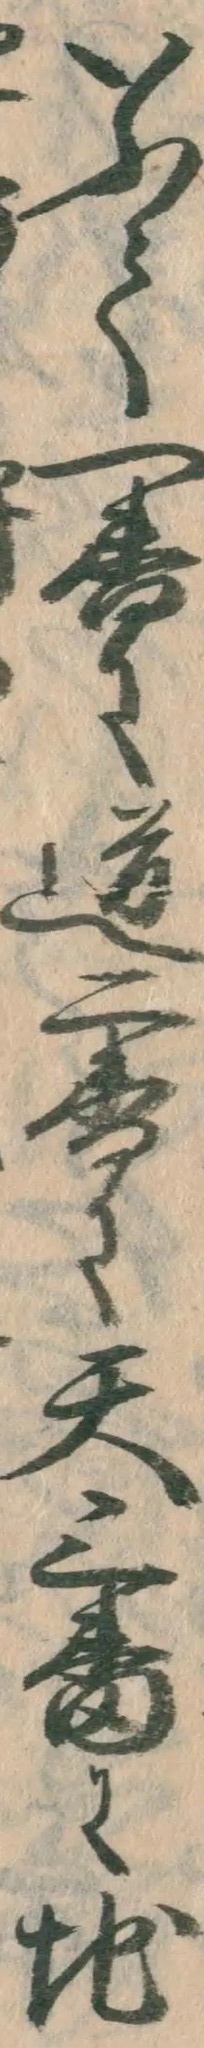いふて一番に道二番に天三番に地
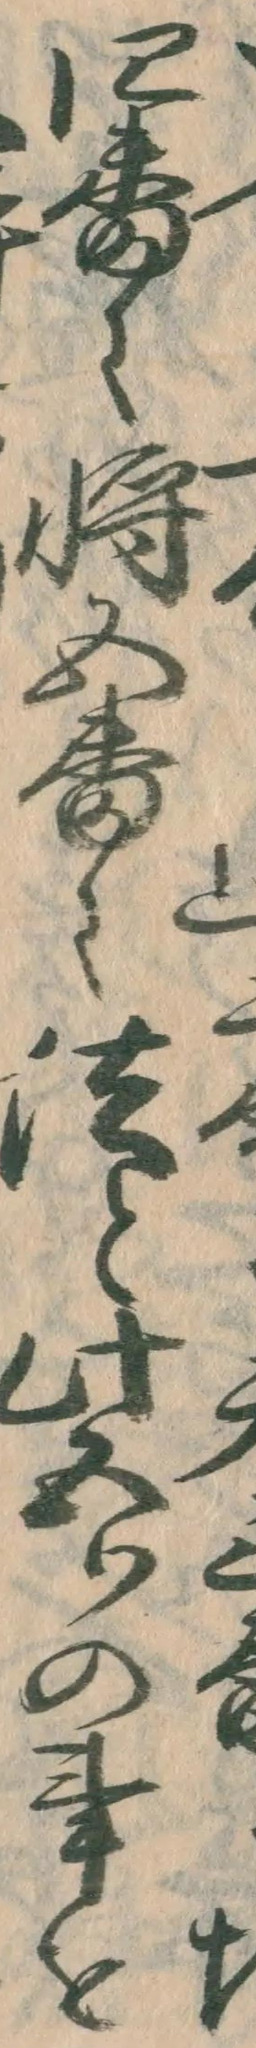四番に将五番に法と此五ツの事を
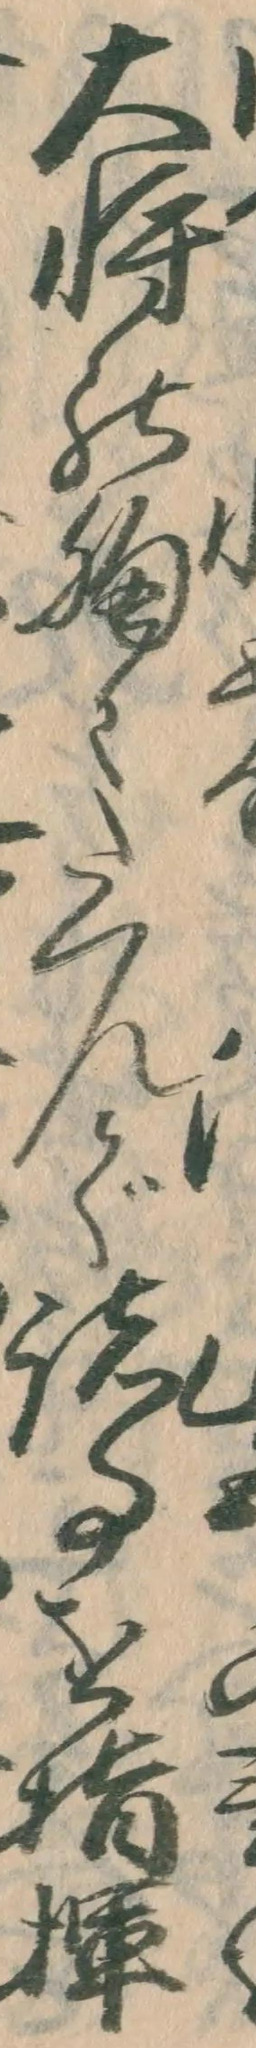大将の胸にたヽんで諸事を指揮
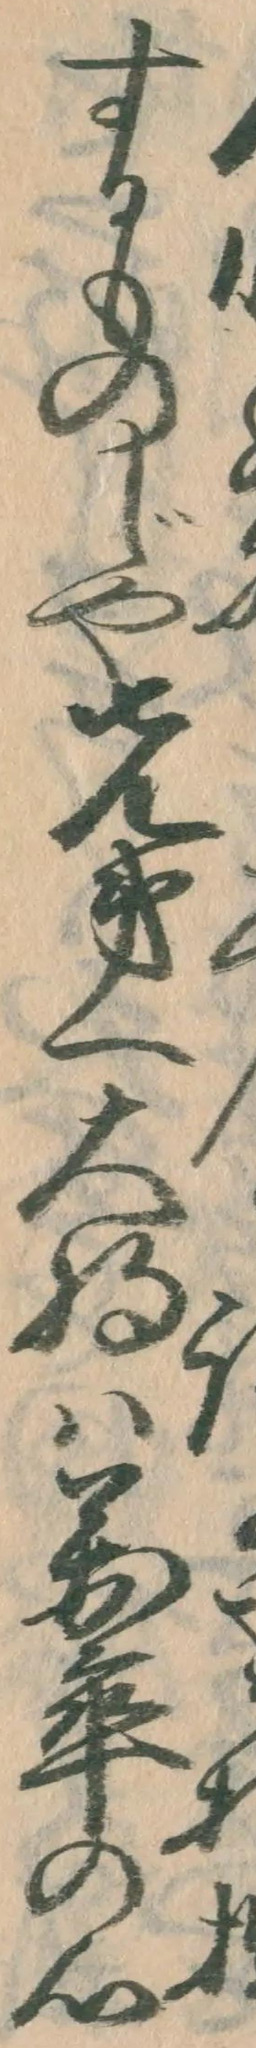するものじや先第一大将はハ萬卒の心

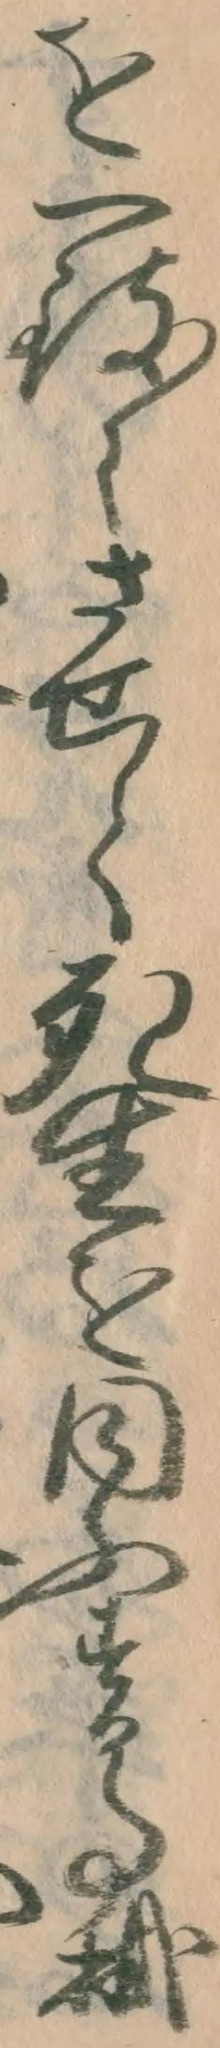を一致にさせて死生を同ふする事掛
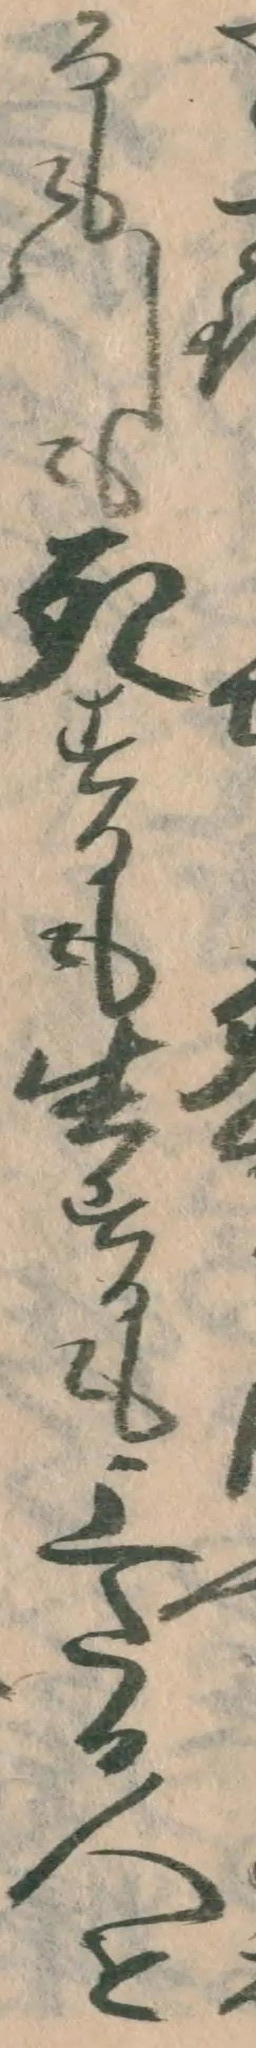るも引も死するも生するも上たる人を
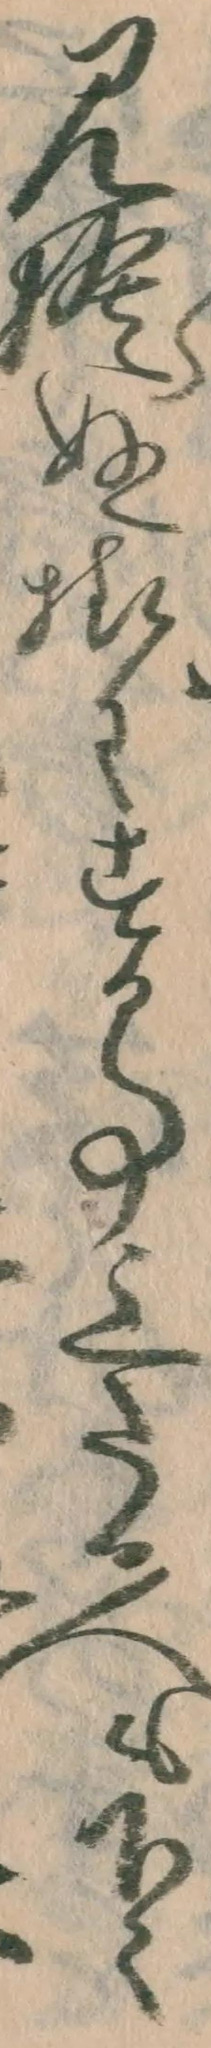見捨ぬ様にする事上たる人も下々
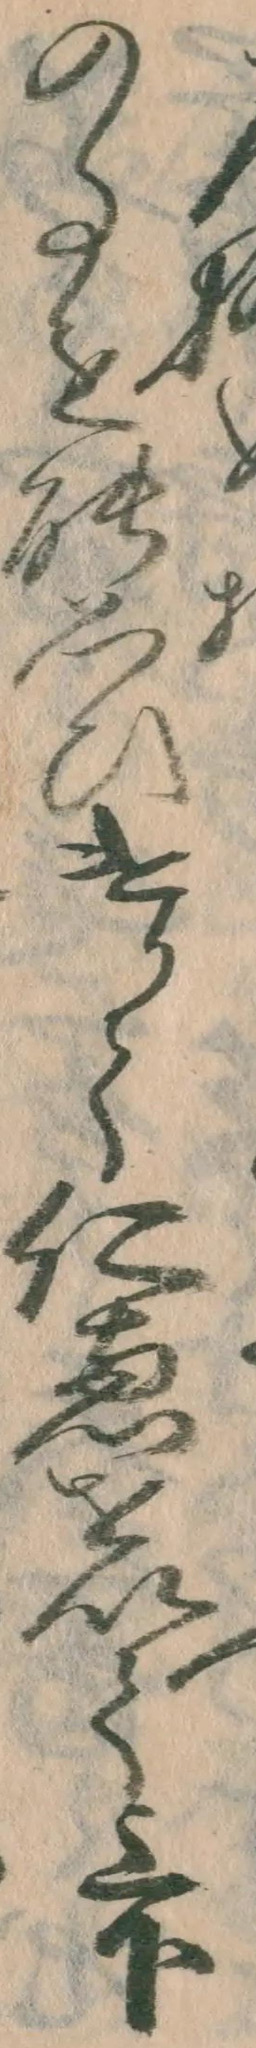の事を能思ひ遣りて仁恵を以て上下
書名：麗斎叢書. 20
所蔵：国立国会図書館 National Diet Library, JAPAN
